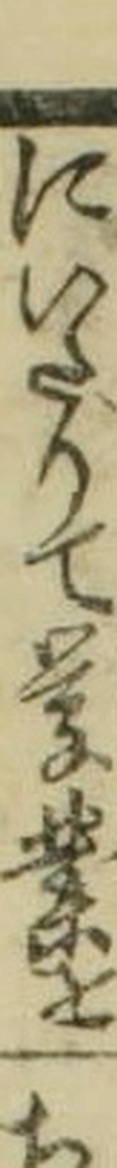にいたりて学業を
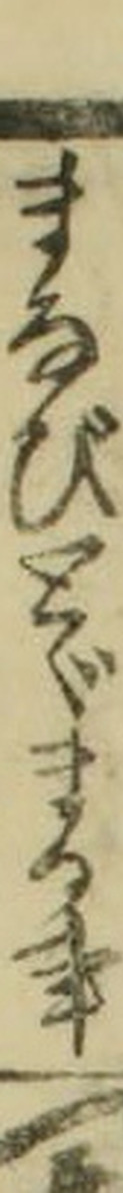まなびとゞまる事
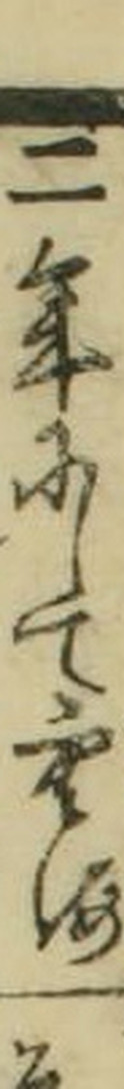二年にして空海
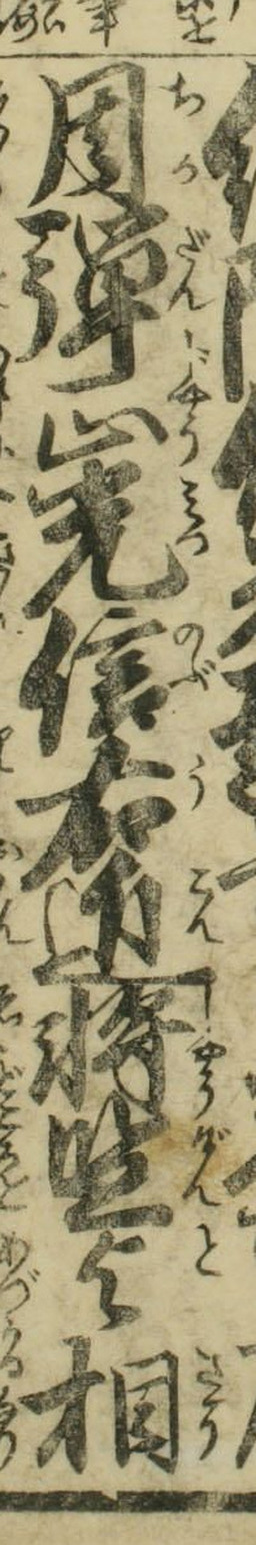周弾正光信右近将監与相
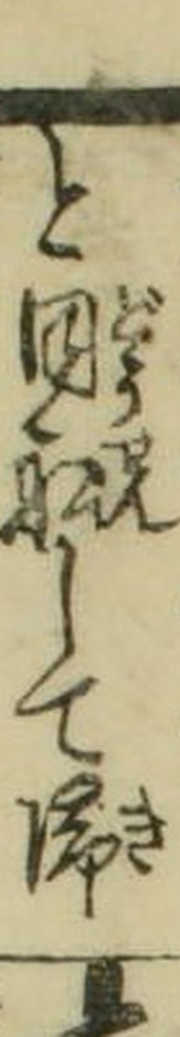と同舩して帰
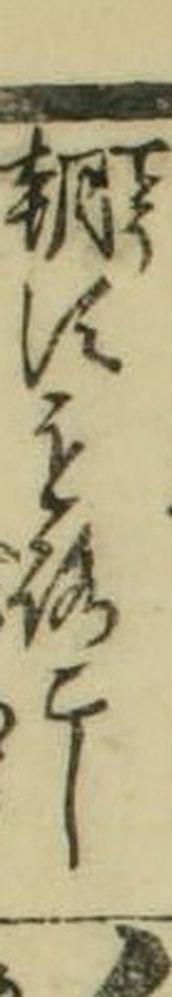朝すもろこし
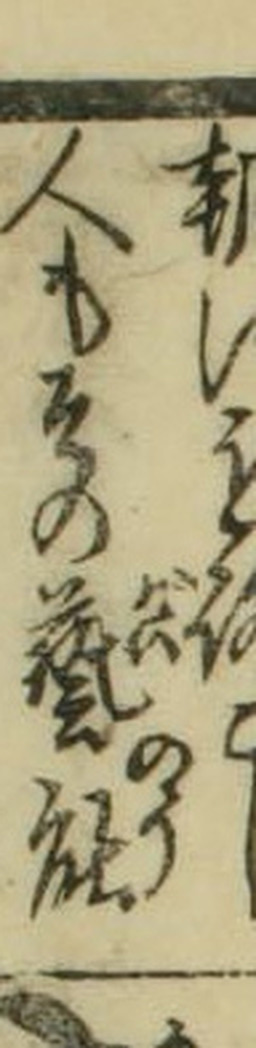人もその藝能
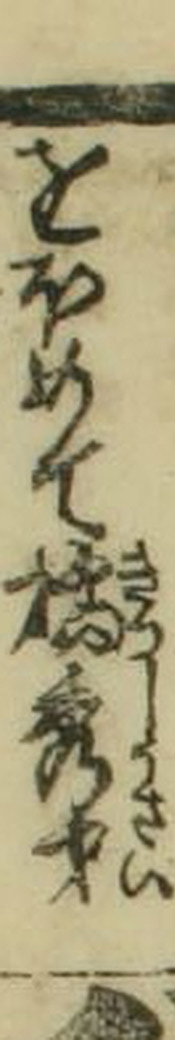をほめて橘秀才
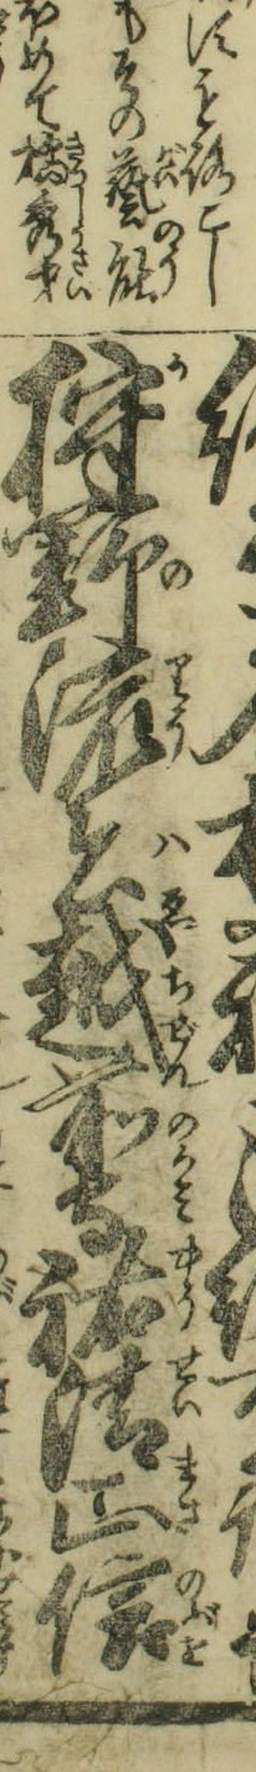狩野流者越前守祐清正信
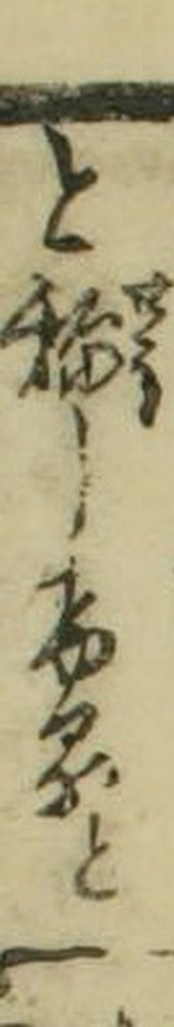と称しけると
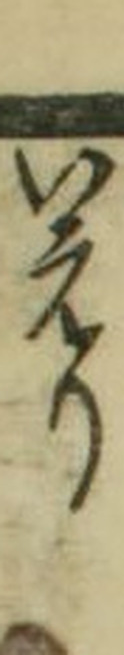いえり

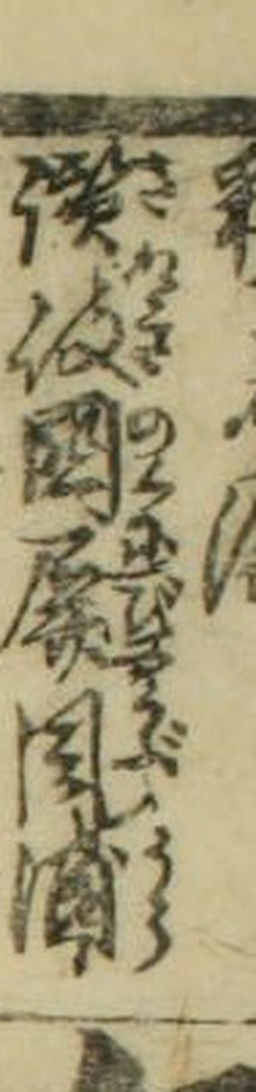讃岐國屏風浦
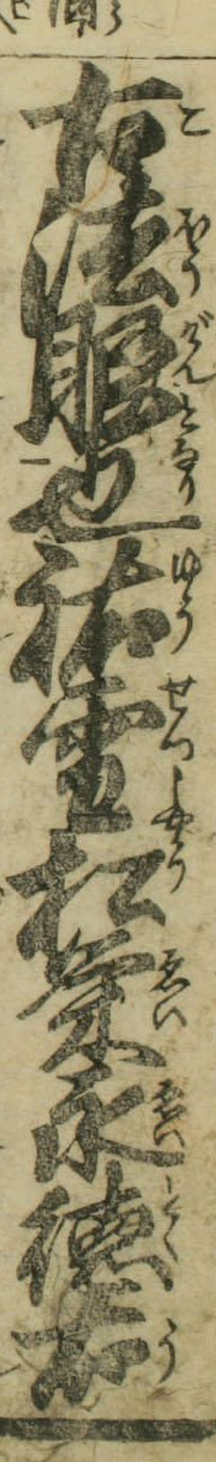古法眼也祐雪松栄永徳右
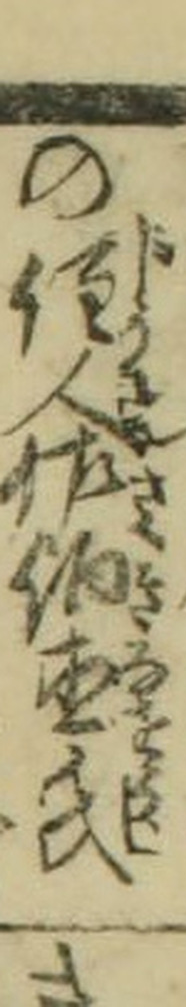の住人佐伯直氏
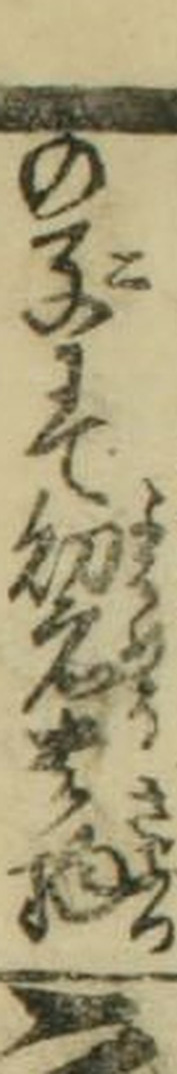の子にて幼名貴物
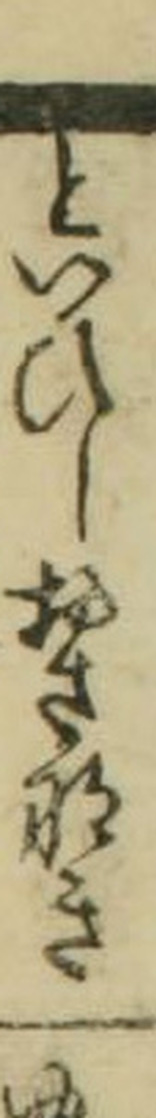といひしおさなき
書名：増補職人往来
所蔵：東京学芸大学教育コンテンツアーカイブ
